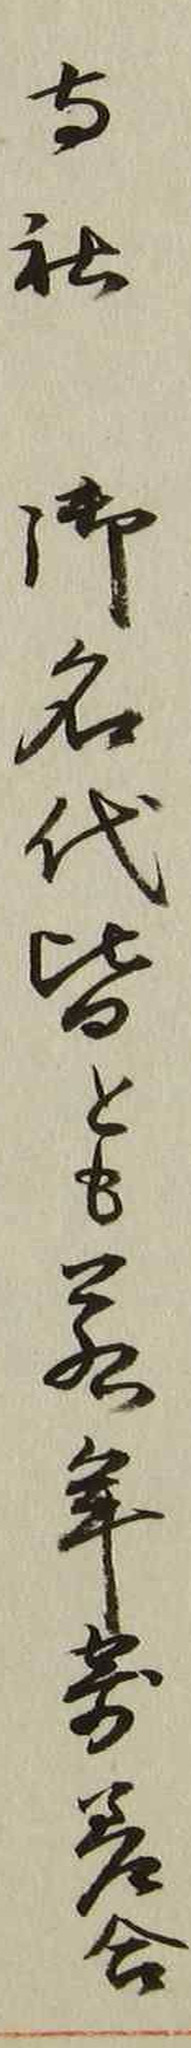寺社御なだ名代皆とも若年寄差合
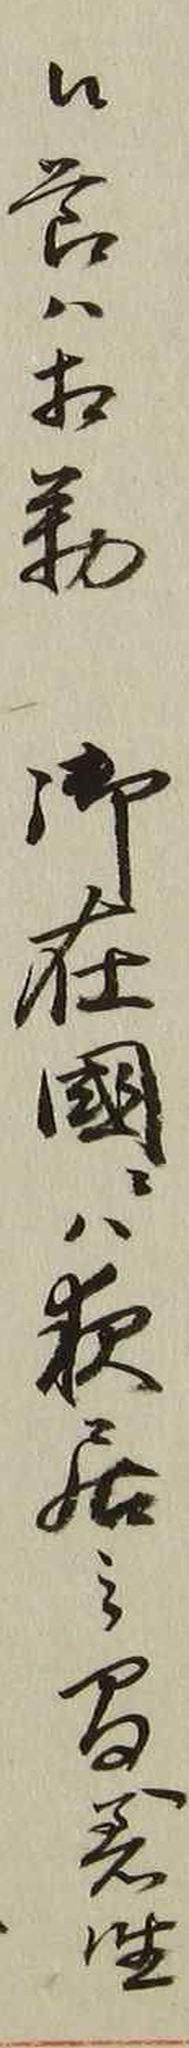候節は相勤御在国には夜居之間へ着座
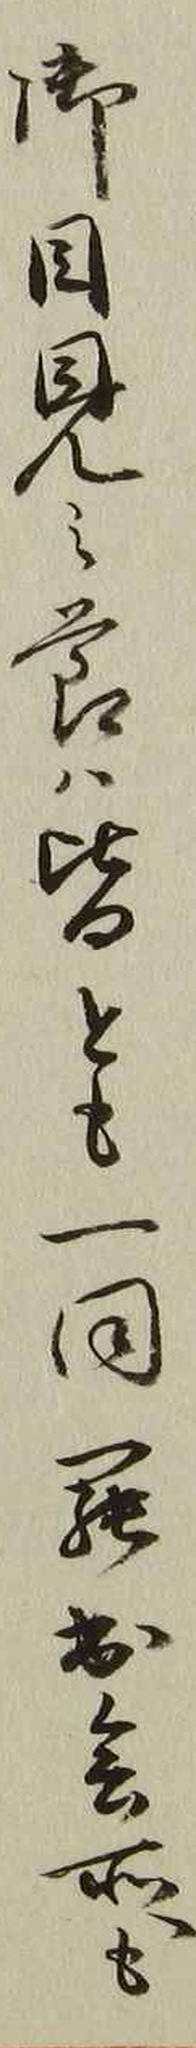御目見之節は皆とも一同罷出会所へも
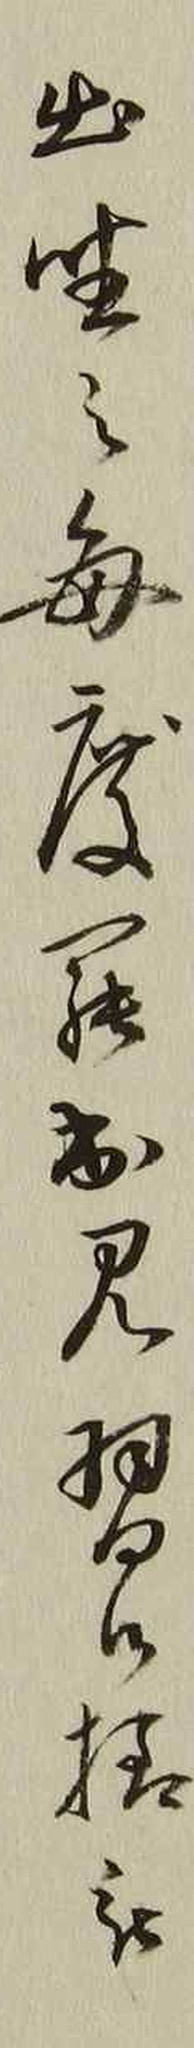出坐之毎度罷出見習候様被
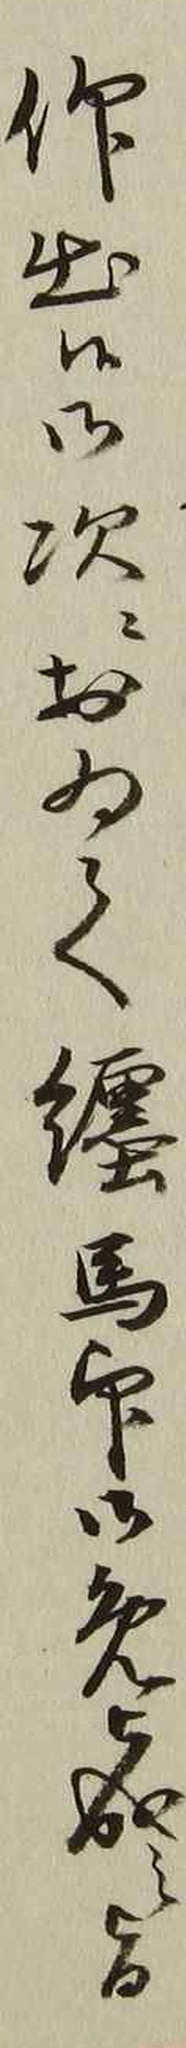仰出候御次におゐて纏馬印御免被成之旨
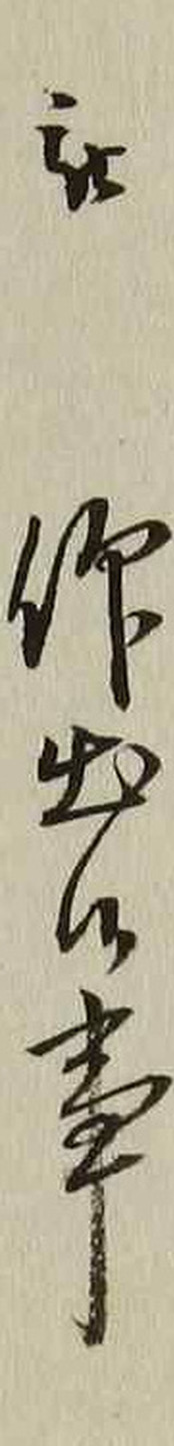被仰出候事
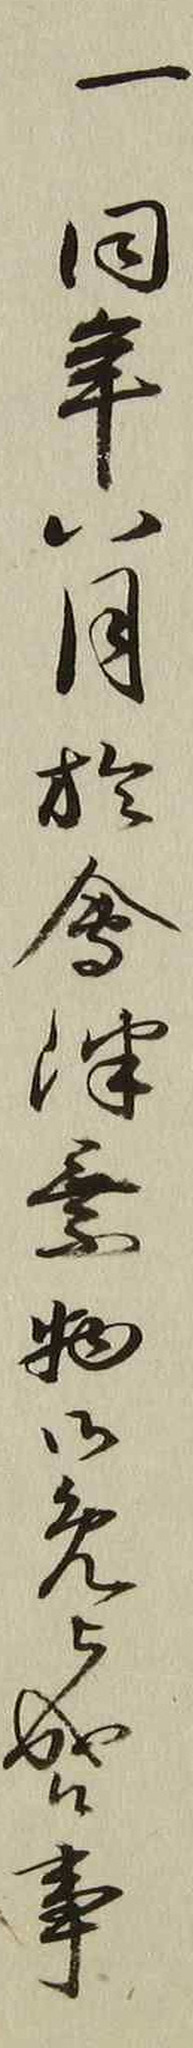一同年八月於会津乗物御免被成候事
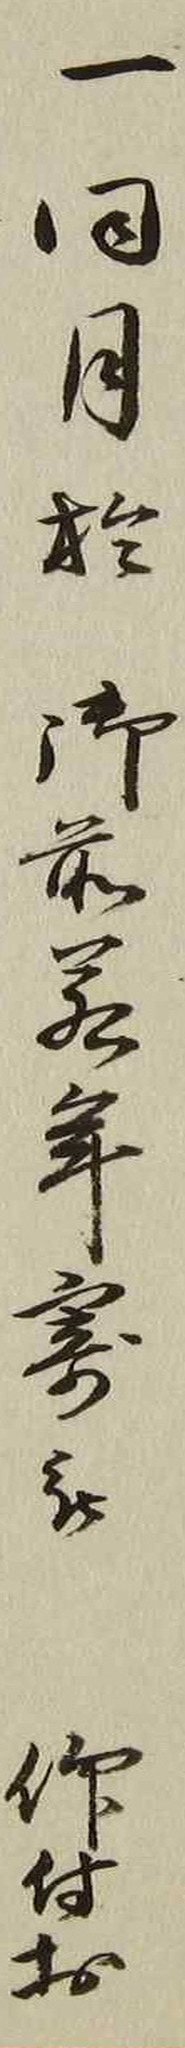一同月於御前若年寄被仰付於
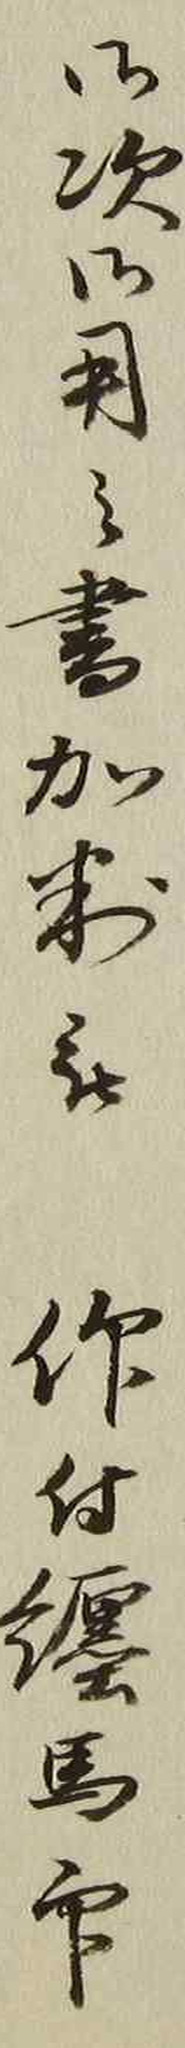御次御用之書加判被仰付纏馬印
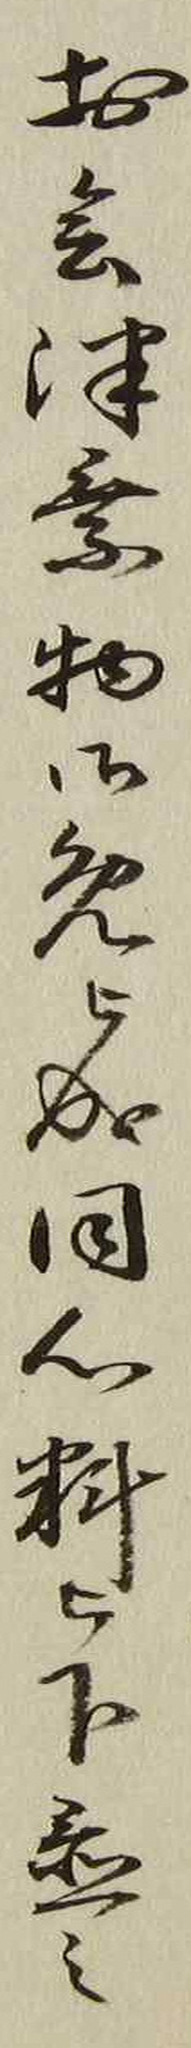於会津乗物御免被成同心料被下置之
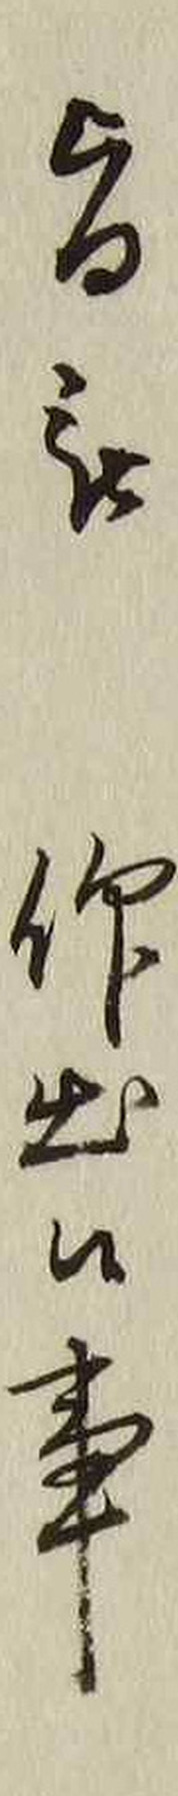旨被仰出候事
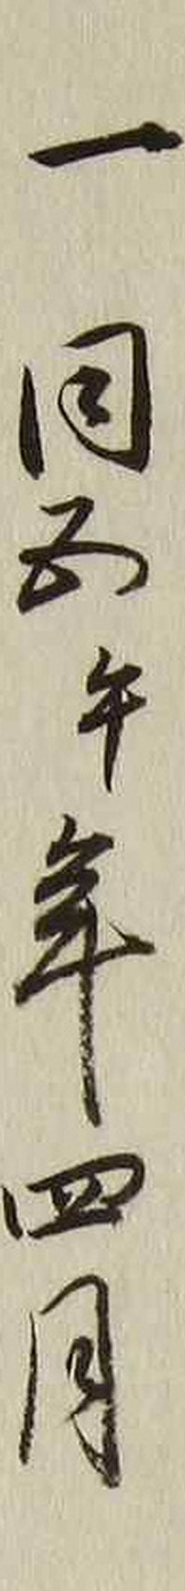一同五午年四月
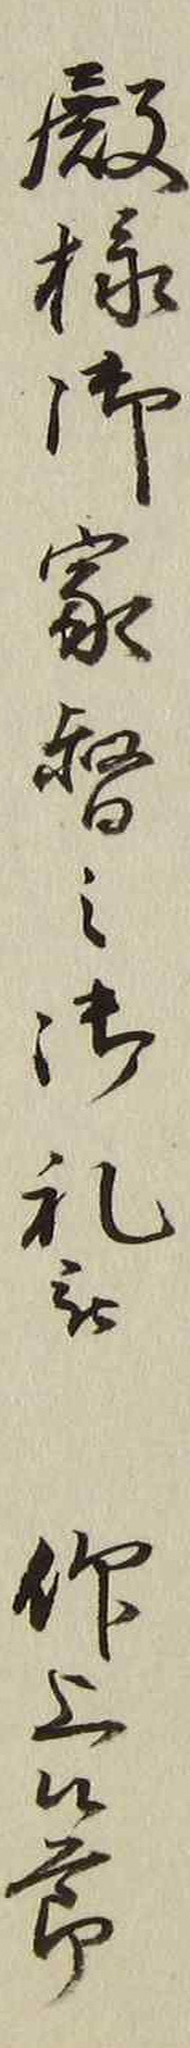殿様御家督之御礼被仰上候節
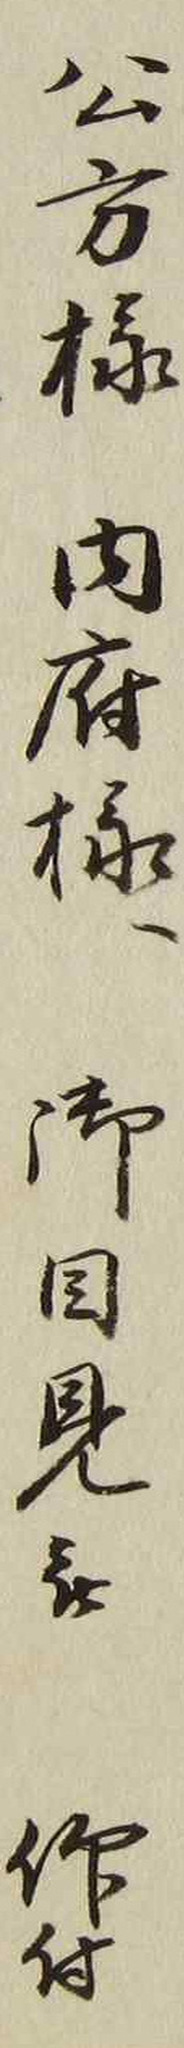公方様内府様へ御目見被仰付
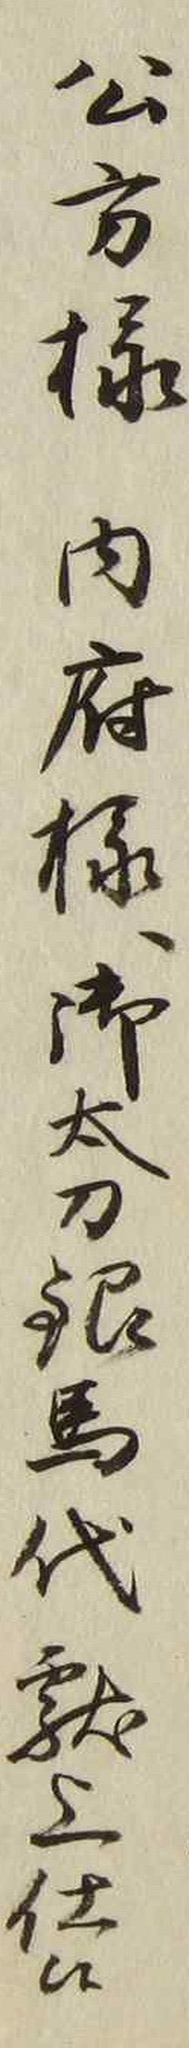公方様内府様へ御太刀銀馬代献上仕候

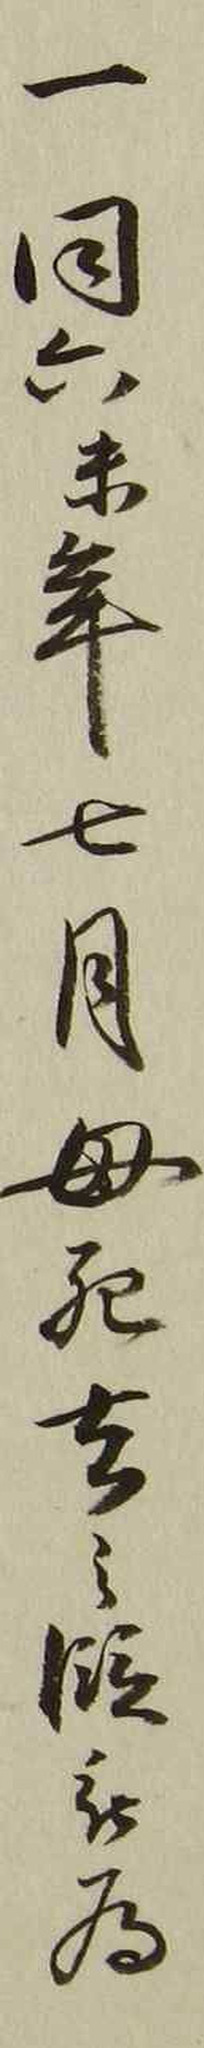一同六未年七月母死去之段被為
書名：諸士系譜　巻之125　た之部1
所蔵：会津若松市立会津図書館
